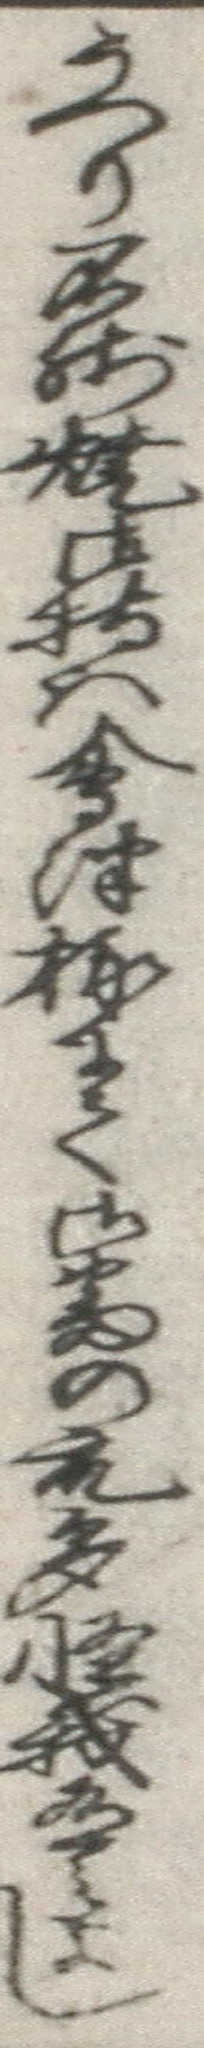うつり不残焼御持は會津様にて御番の衆多怪我有之よし
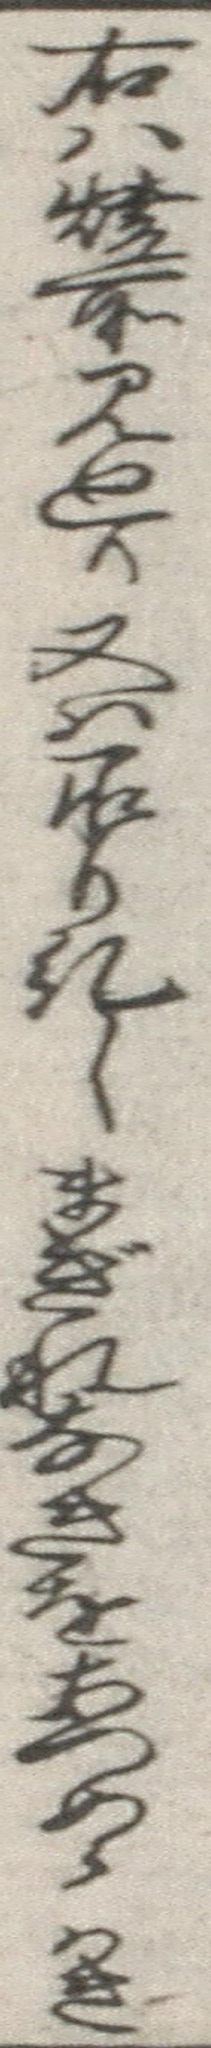右は焼所見廻り又は承り糺しまぎれなきをあつめてかき
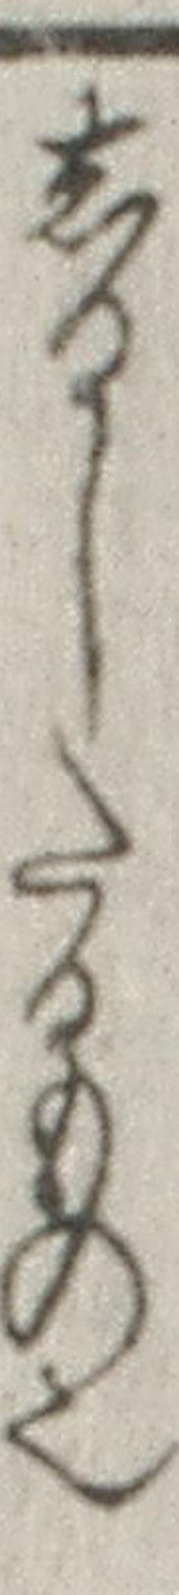しるしたるもの也
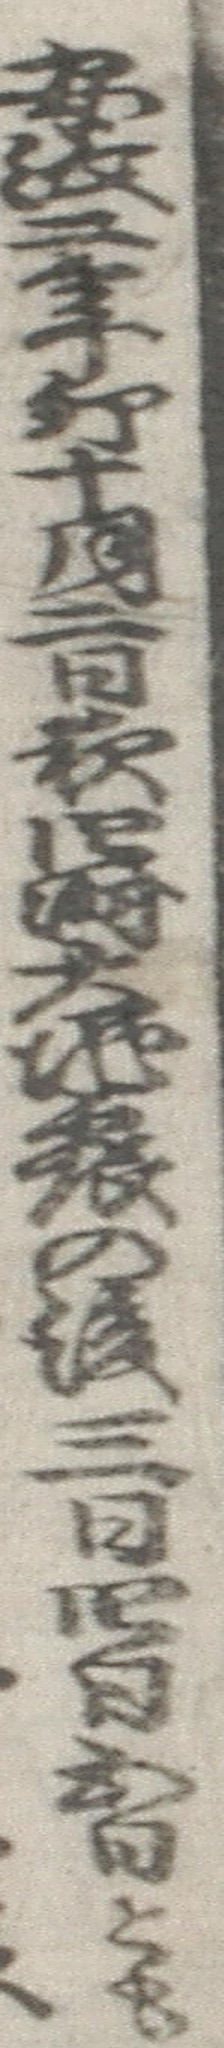安政二年卯十月二日夜四時大地震の後三日四日五日とも
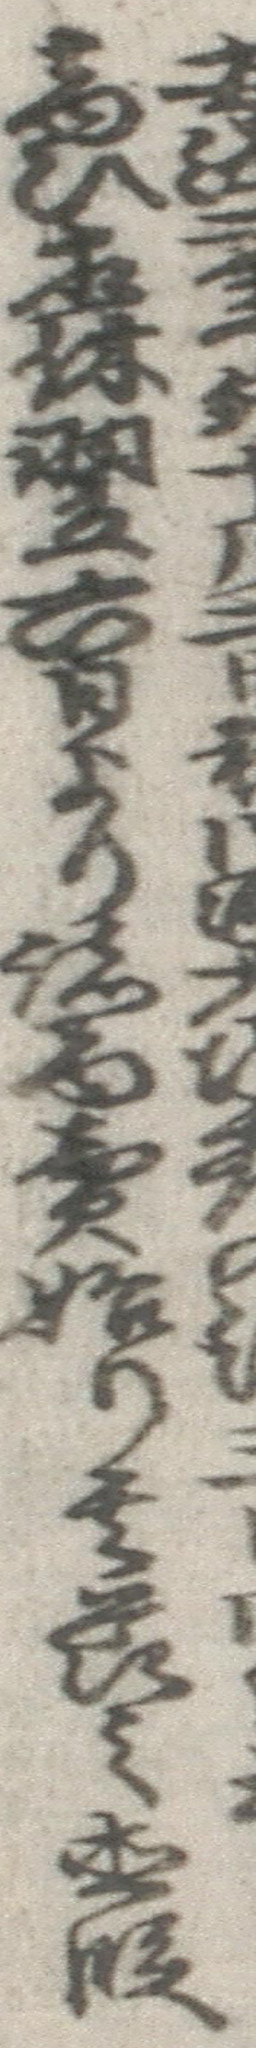商ひ相休翌六日より諸商売始り其節之直段
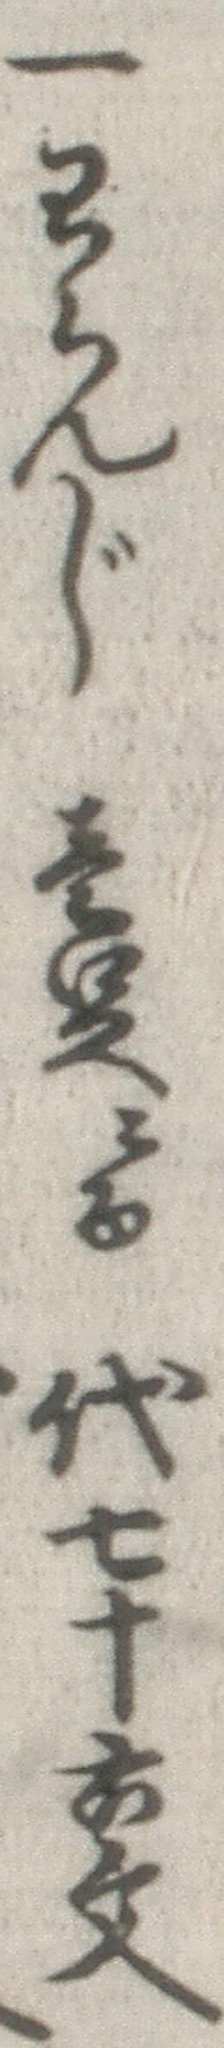一わらんじ壱足ニ而代七十六文
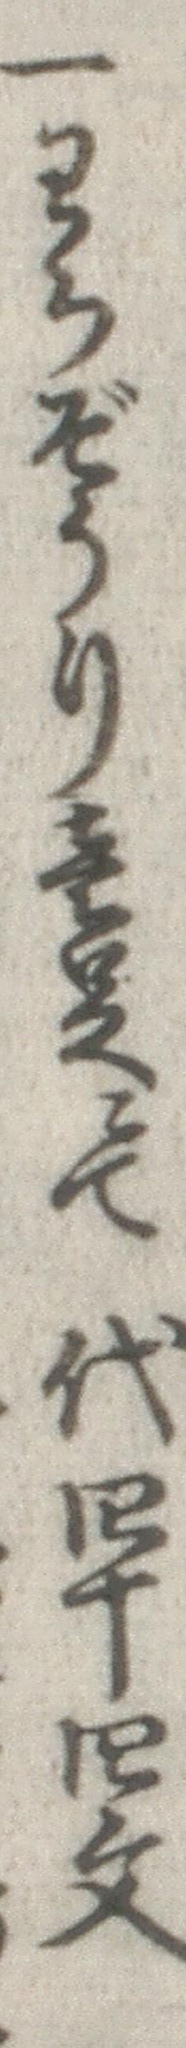一わらぞうり一足にて代四十四文
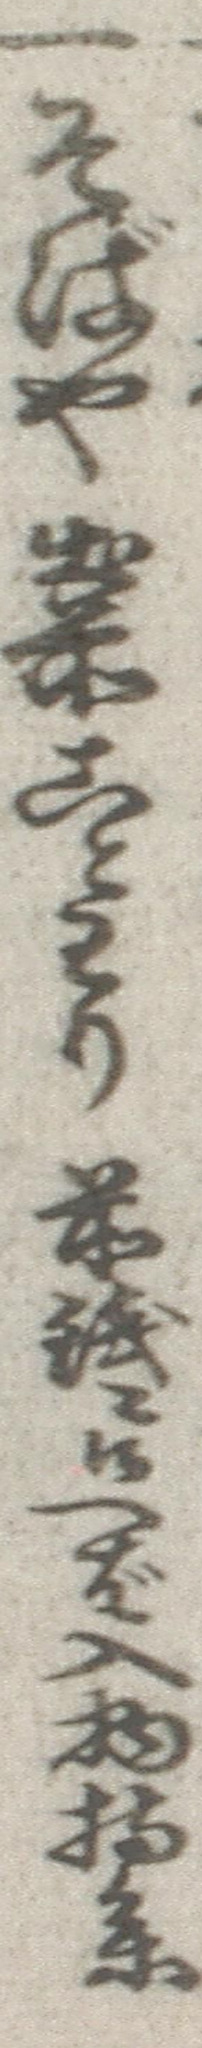一そばや出前ことわり前銭に候へば入物持参
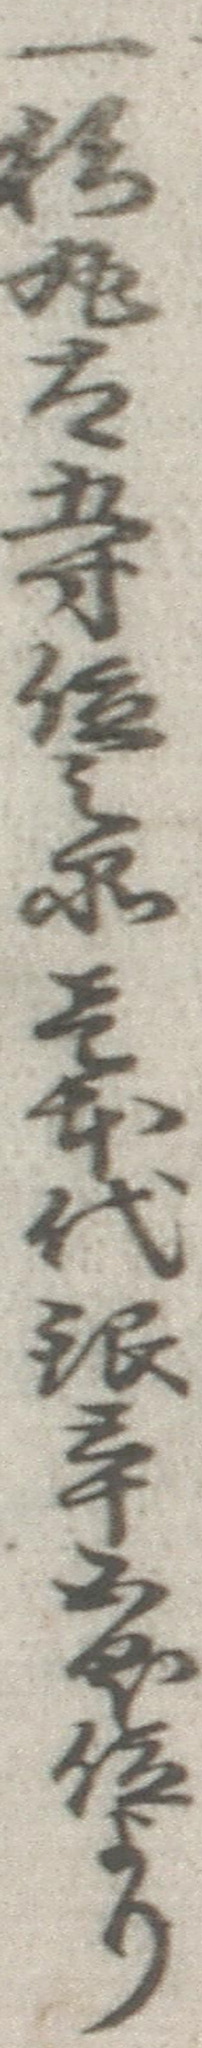一杉丸太五寸位之品壱本代銀三十五匁位より
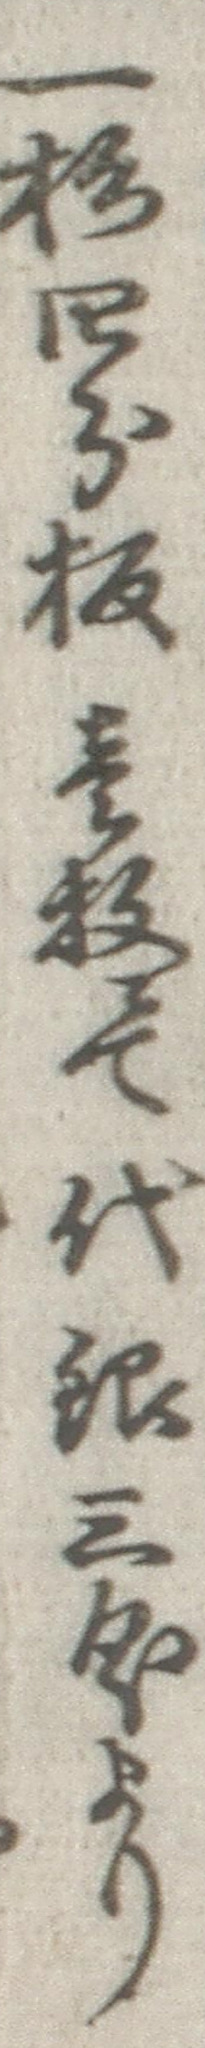一杉四分板壱枚にて代銀三匁より
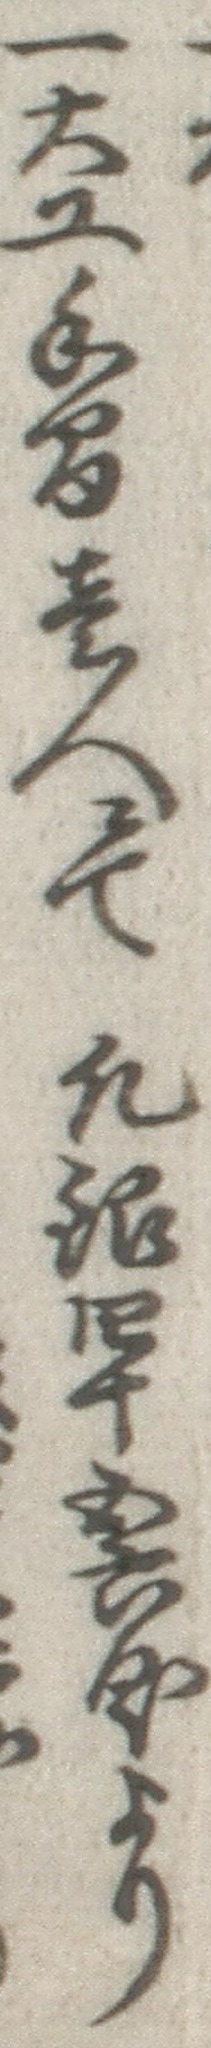一大工手間壱人にて凡銀四十五六匁より

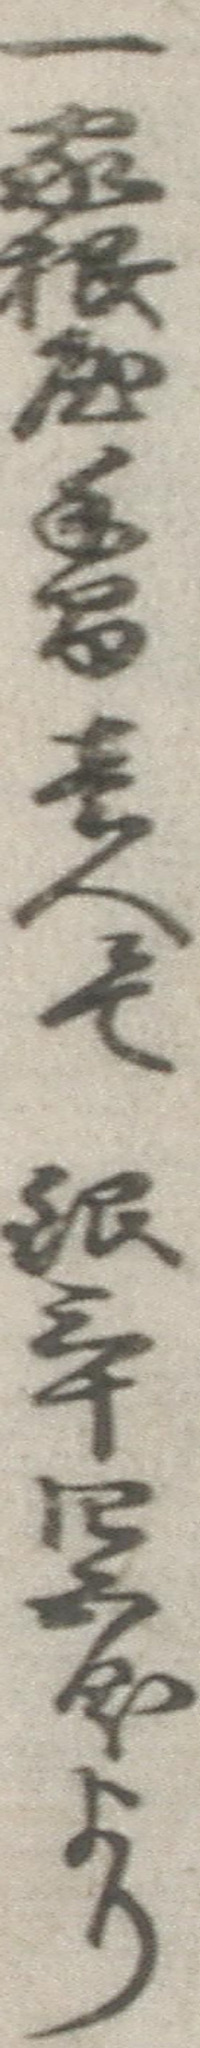一家根屋手間壱人にて銀三十四五匁より
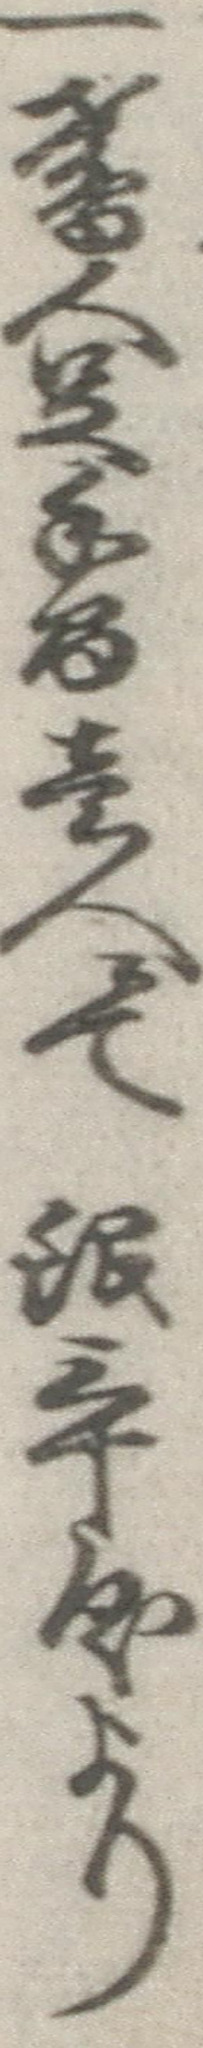一鳶人足手間壱人にて銀三十匁より
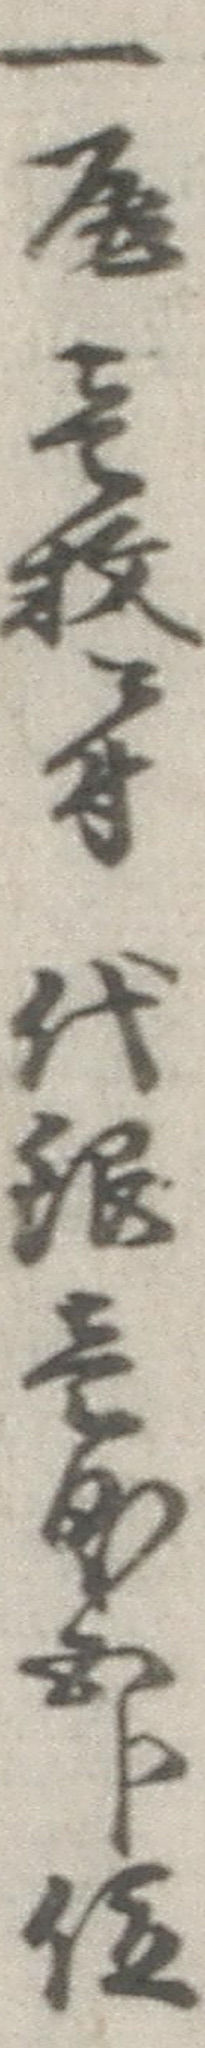一瓦壱枚に付代銀壱匁五分位
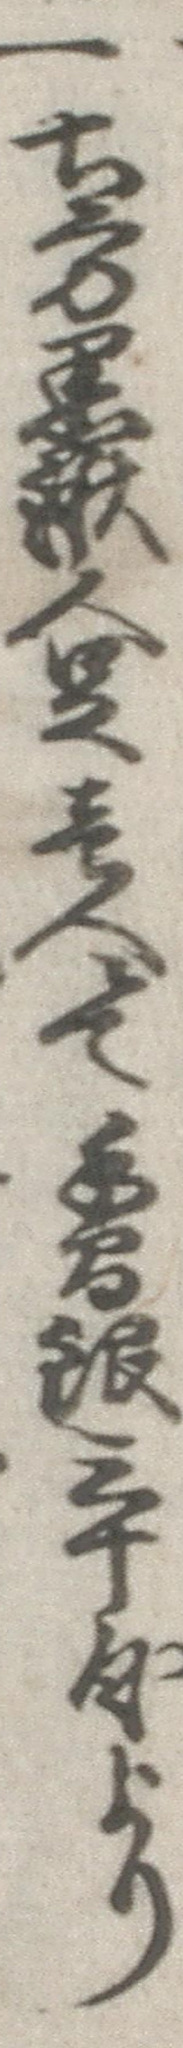一土方黒鍬人足壱人にて手間銀三十匁より
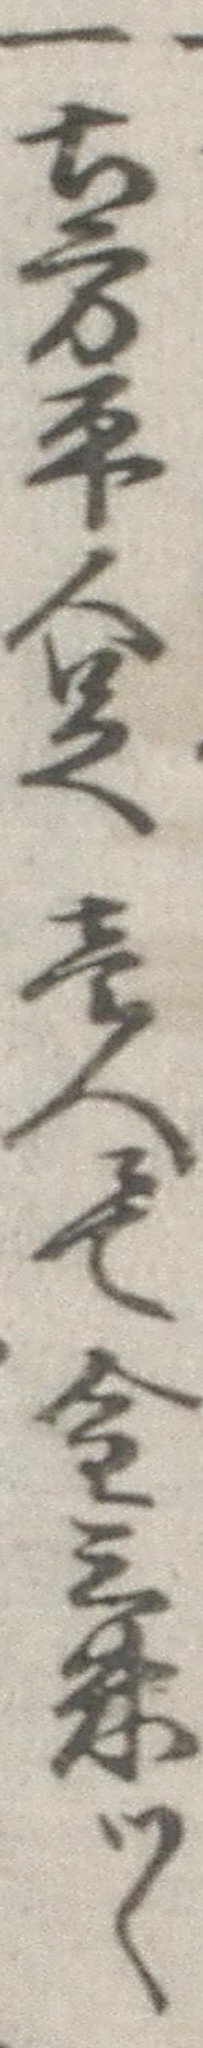一土方平人足壱人にて金三朱ツヽ
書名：大地震焼場細見記
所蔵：東京大学地震研究所図書室 Earthquake Research Institute Library, The University of Tokyo, JAPAN
